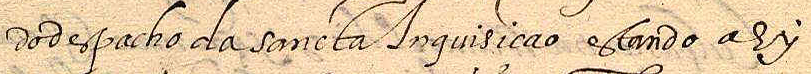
do despacho da sancta Inquisição estando ahy
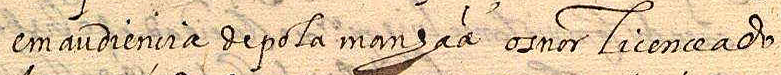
em audiençia de pola manhaā o snōr Liçençeado
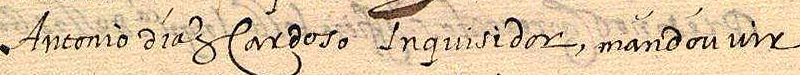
Antonio diaz Cardoso Inquisidor, mandou uir
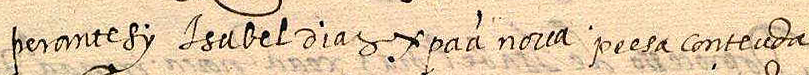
perante sy Isabel dias xpaā noua presa conteuda
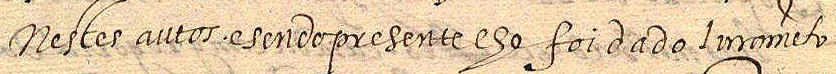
nestes autos. e sendo presente lhe foi dado Iuramēto
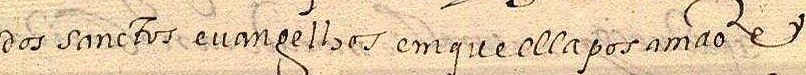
dos sanctos euangelhos em que ella pos a mão e
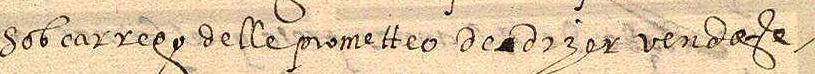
sob carrego delle prometteo de dizer verdade/
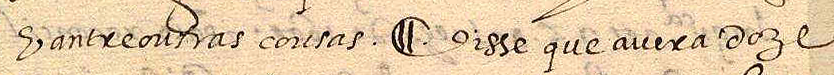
E antre outras cousas. ¶ disse que auera doze
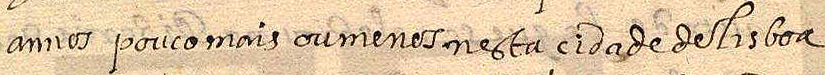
annos pouco mais ou menos nesta cidade de lisboa
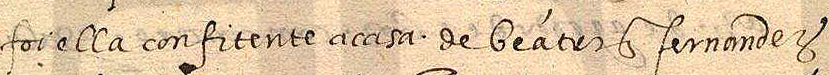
foi ella confitente a casa. de beatriz fernandez
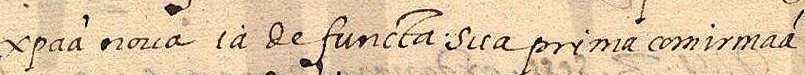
xpaā noua ia defuncta sua prima com irmaā
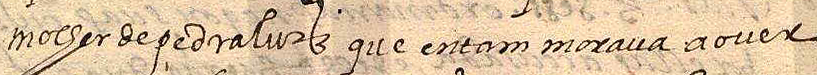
molher de pedralur̄z que entam moraua ao uer
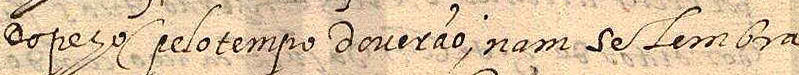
do pezo (pelo tempo do uerão, nam se lembra
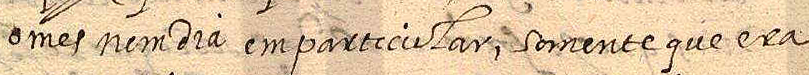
o mes nem dia em particular, somente que era
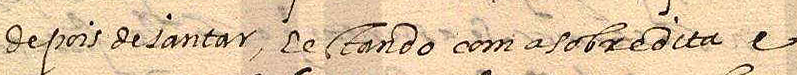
depois de iantar, E estando com a sobredita e
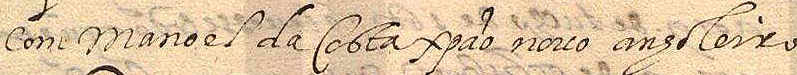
com Manoel da Costa xpão nouo anzoleiro
